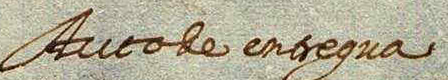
Auto de entregua
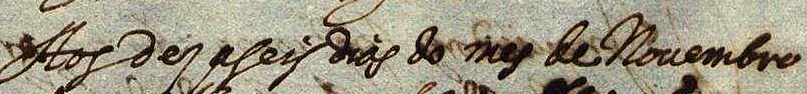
Aos dezaseis dias do mes de Nouembro
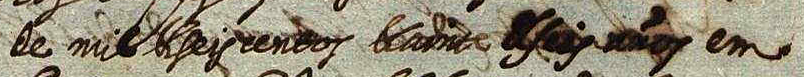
de mil & seiscentos & uinte & seis an̄os em
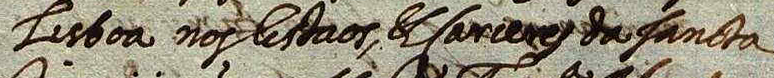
Lisboa nos Estaos, & Carceres da sancta
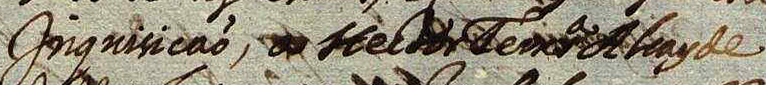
Jnquisiçaõ, a Hector Teixra Alcayde
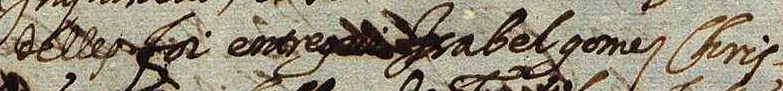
delles foi entregue Jsabel gomez Chris
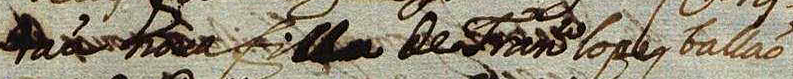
taã noua filha de Franco lopez ballaõ
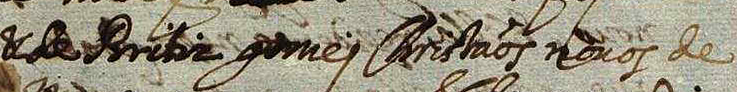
& de Britiz gomez Christaõs nouos de
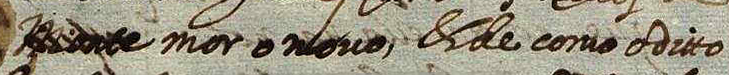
Montemor o nouo, & de como o ditto
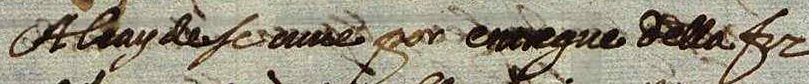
Alcayde se ouue por entregue della fiz
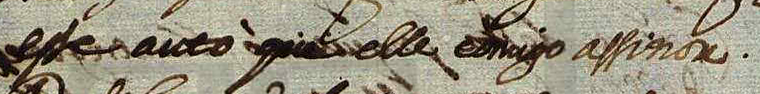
este auto que elle comigo assinou.
